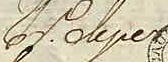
Tr.o de per
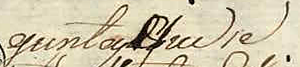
gunta que se
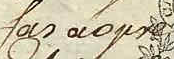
fas ao pre
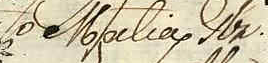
to Matias Glz.
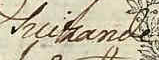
Guizande
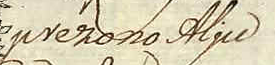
prezo no Alju
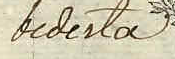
be desta
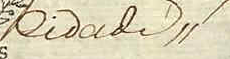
Cidade//
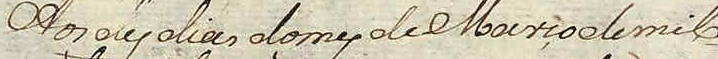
Aos des dias do mes de Março de mil
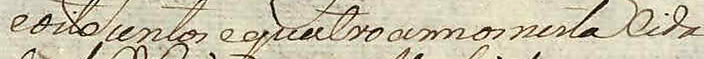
e oitecentos e quatro annos nesta Cida
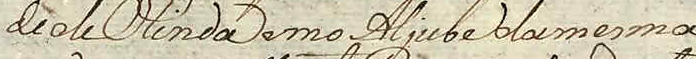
de de Olinda e mo Aljube da mesma
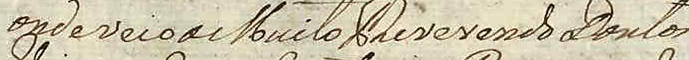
onde veio o Muito Reverendo Doutor
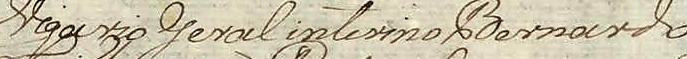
Vigario Geral interino Bernardo
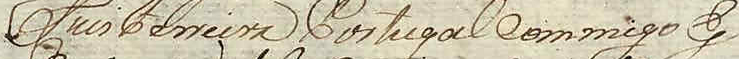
Luis Ferreira Portugal commigo Es
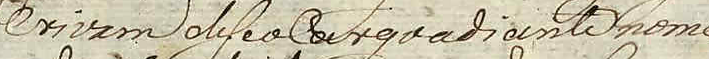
crivam de seo Cargo adiante nome
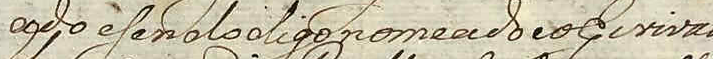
ado e sendo digo nomeado e o Escrivaõ
